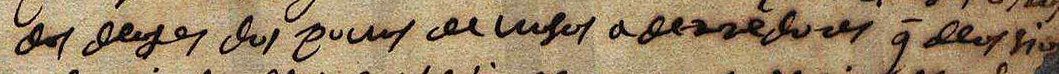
dos deoses dos pouos de uosos adorredores q̄ deos sio
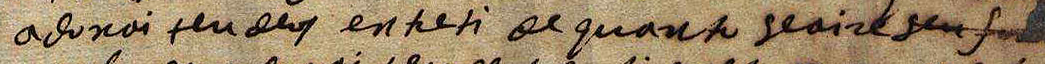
adonai teu deos entre ti de quanto se aire seu f
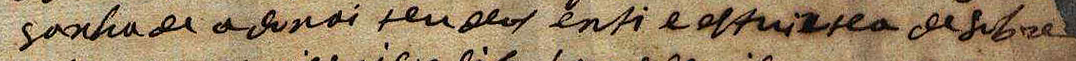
sanha de adonai teu deos en ti destuirtea de sobre
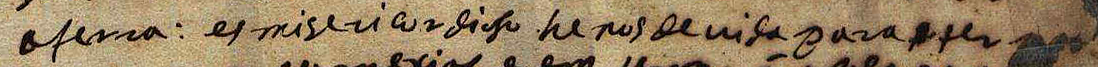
a terra: es misericordioso he nos de uida para ter
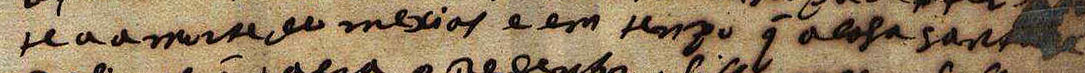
te aa morte do mexias e em tenpo q̄ a casa san
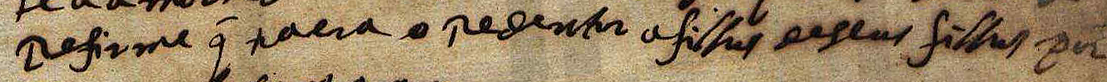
Refirme q̄ traera o Redentor a filhos de seus filhos por
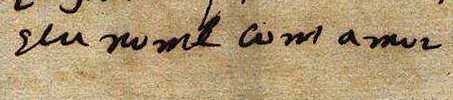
seu nome com amor
